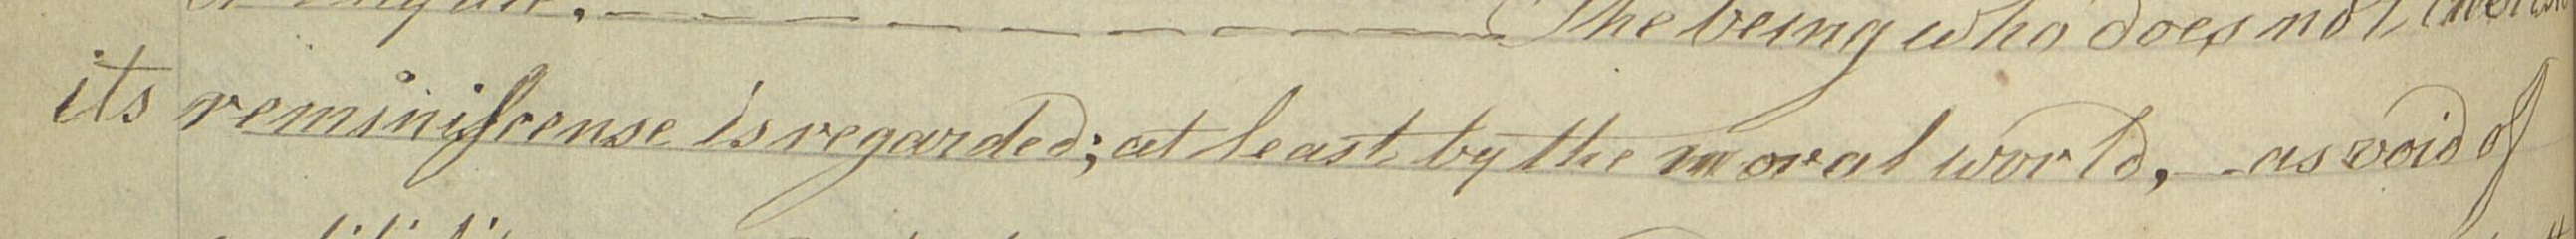its reminiscense is regarded; at least by the moral world, as void of
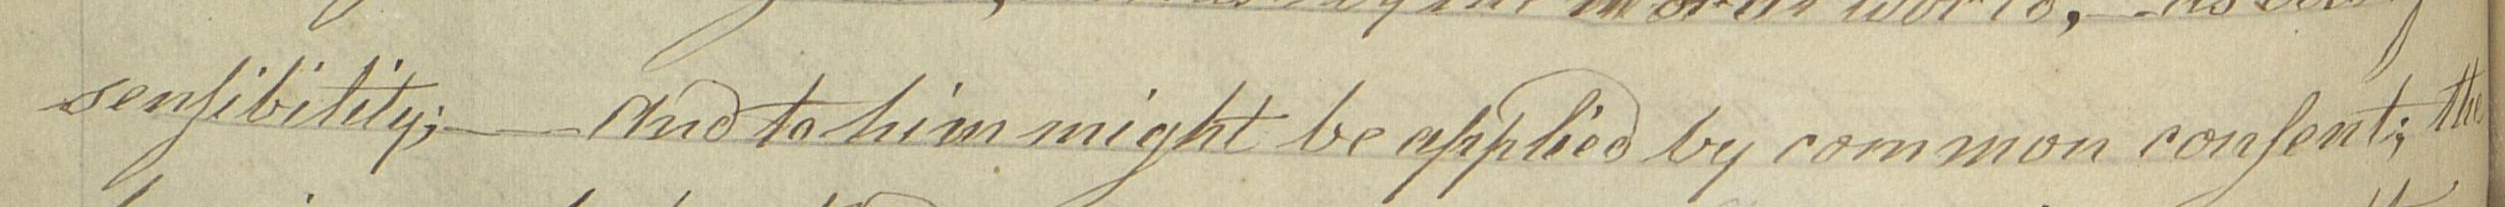sensibility; and to him might be applied by common consent; the
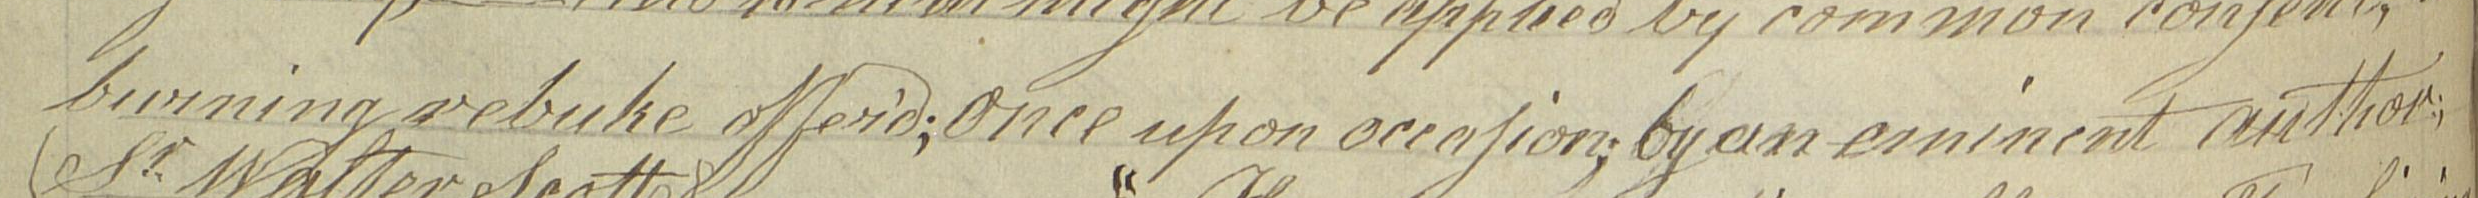burning rebuke offer'd; Once upon occasion; by an eminent author
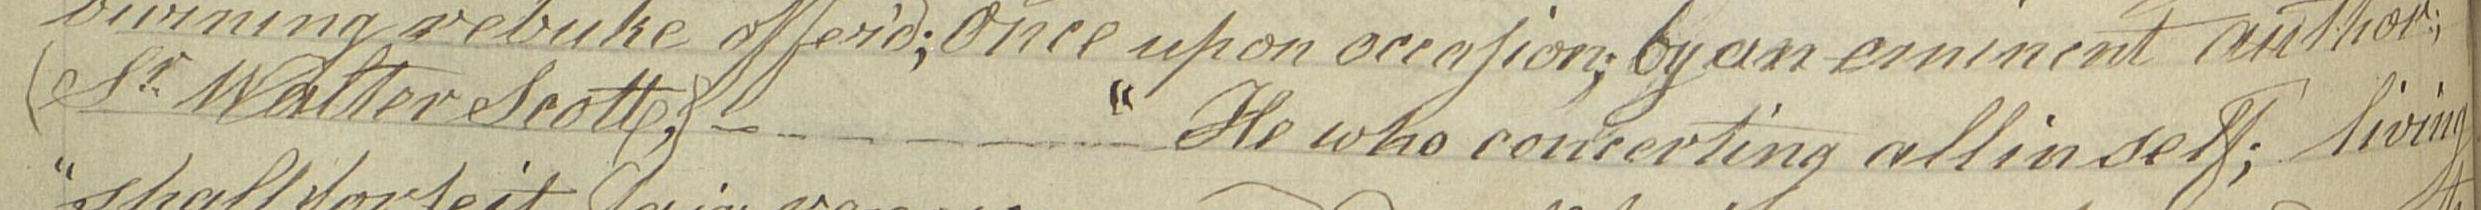(S^r. Walter Scott,) "He who concerting all in seIf; living
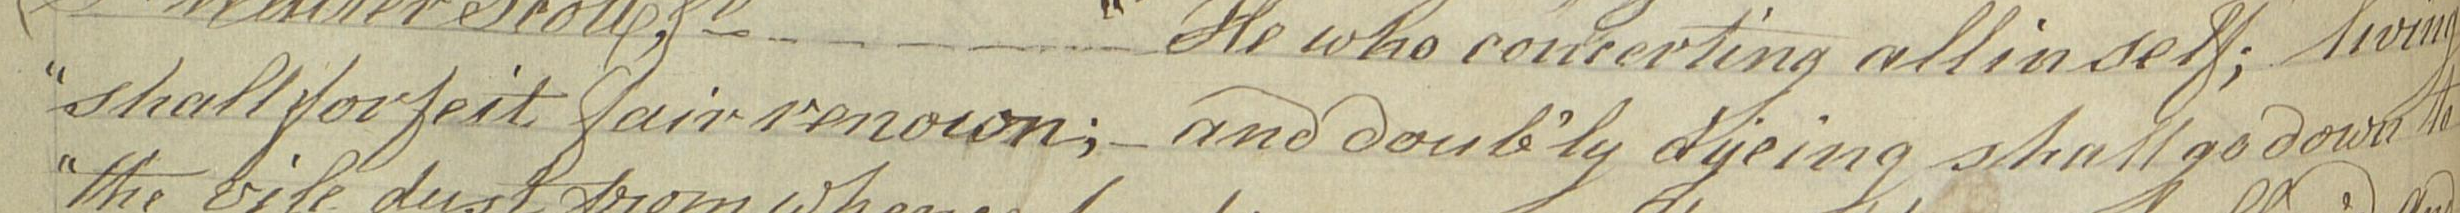"shall forfeit fair renown; and doubly dyeing shall go down to
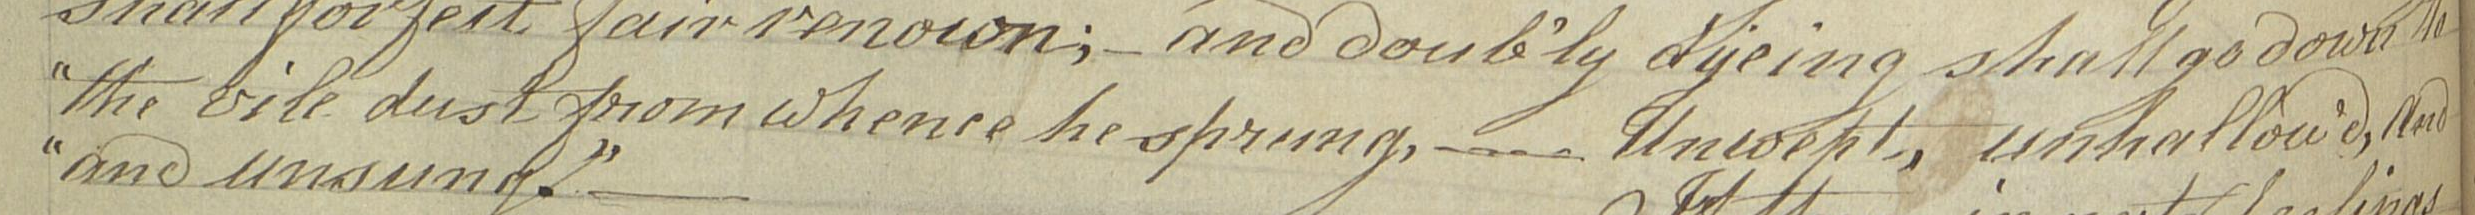"the vile dust from whence he sprung, Unwept, unhallow'd, and
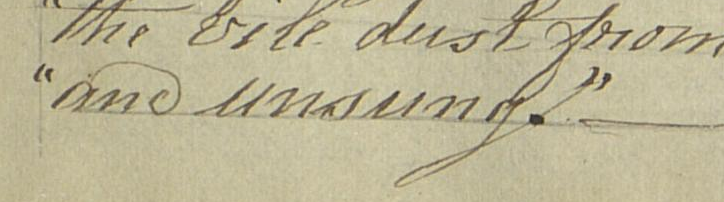"and unsung."
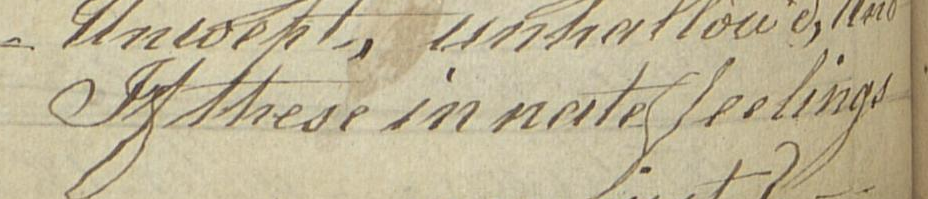If These innate feelings
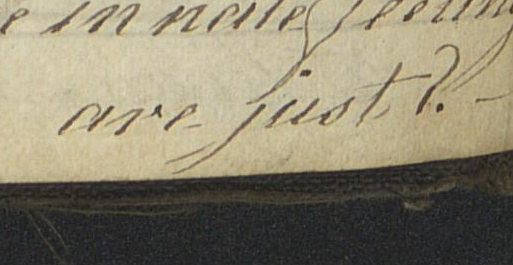are just?
